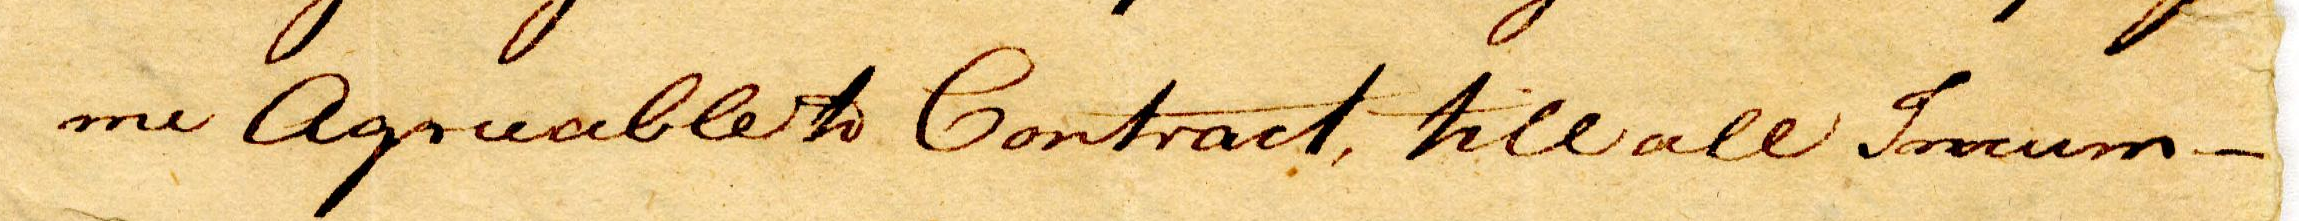me Agreeable to Contract, till all Incum-
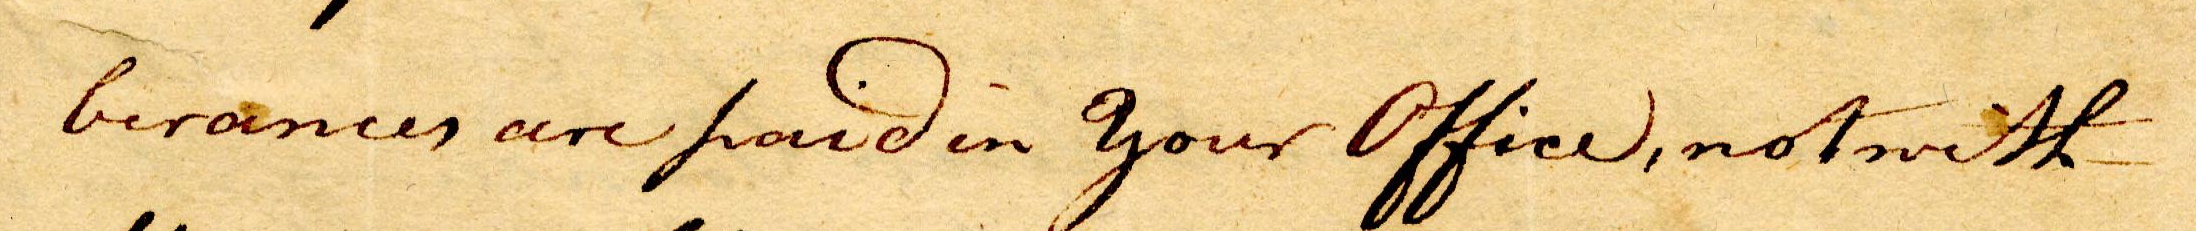berances are paid in Your Office, not with-
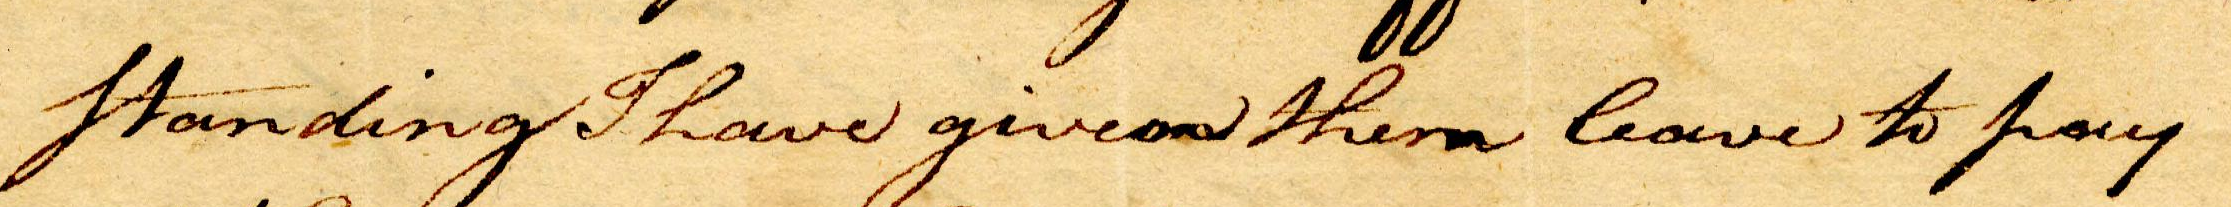standing I have given them leave to pay
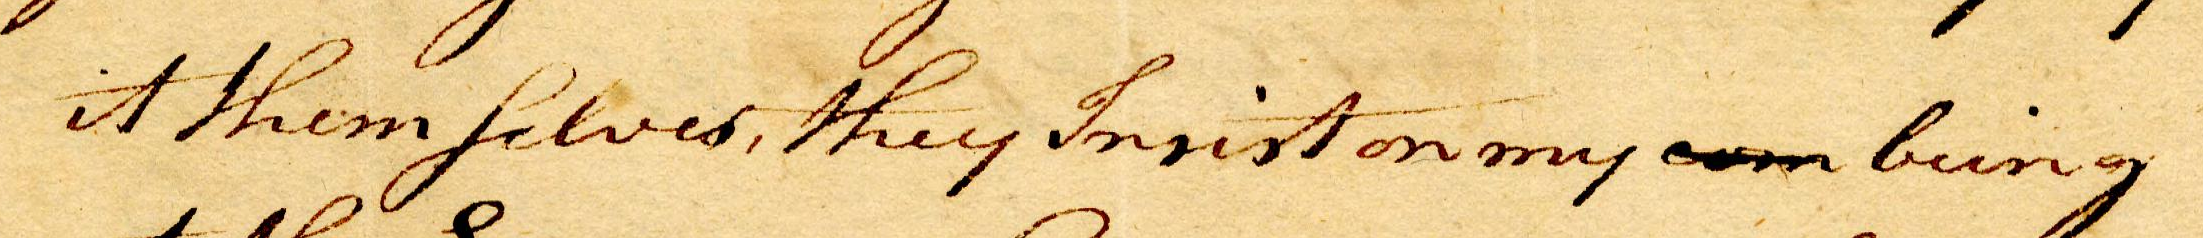it them selves, they Insist on my [com] being
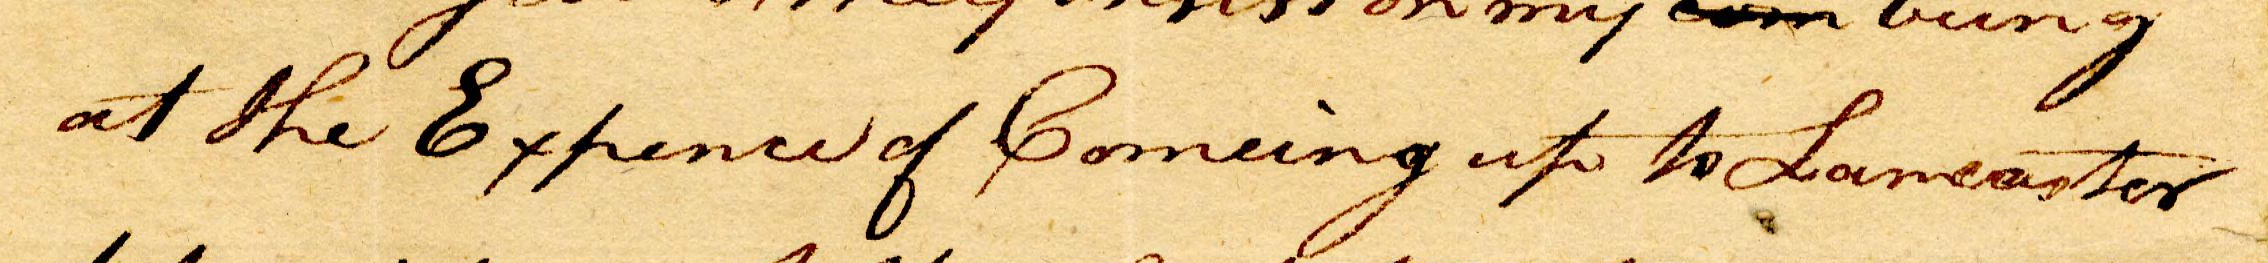at the Expence of Comeing up to Lancaster
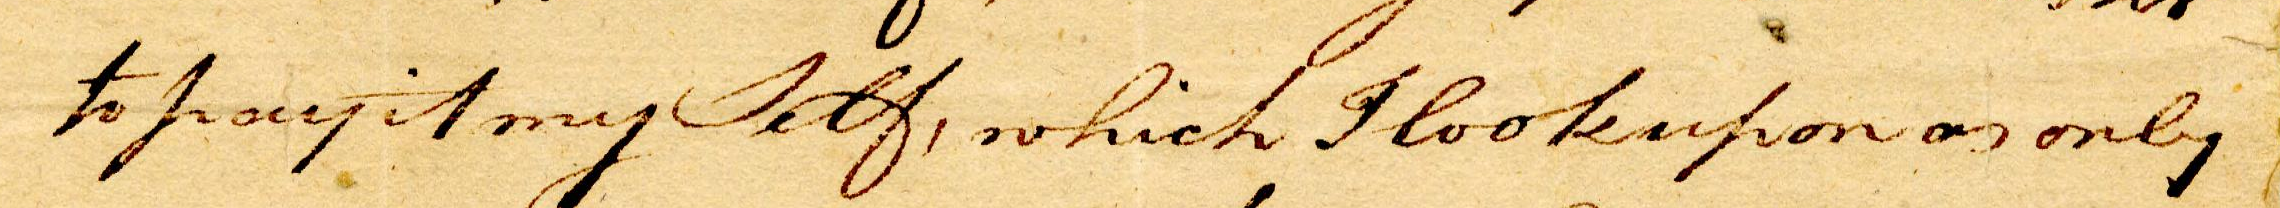to pay it my Self, which I look upon as only
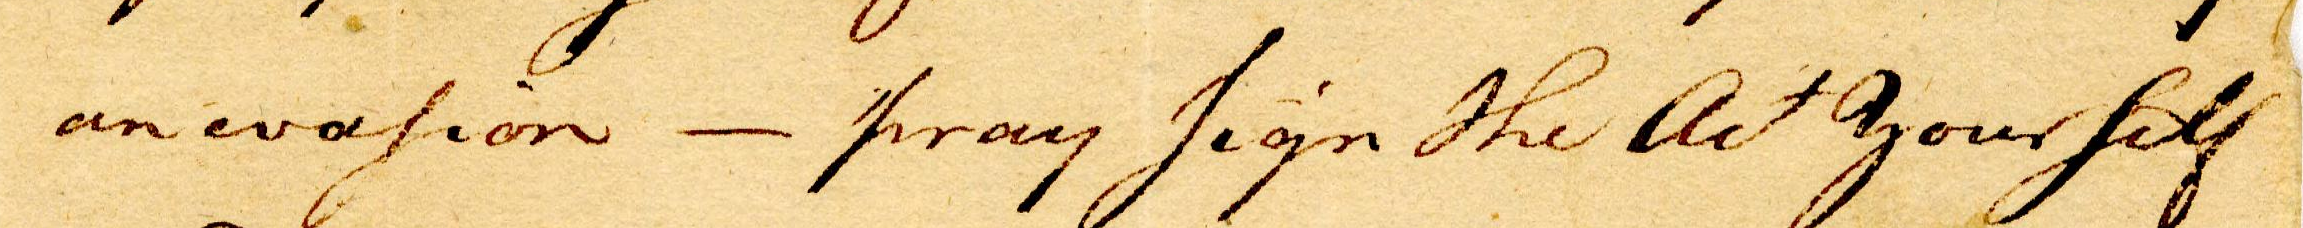an evasion- pray sign the Ac^t Your Self
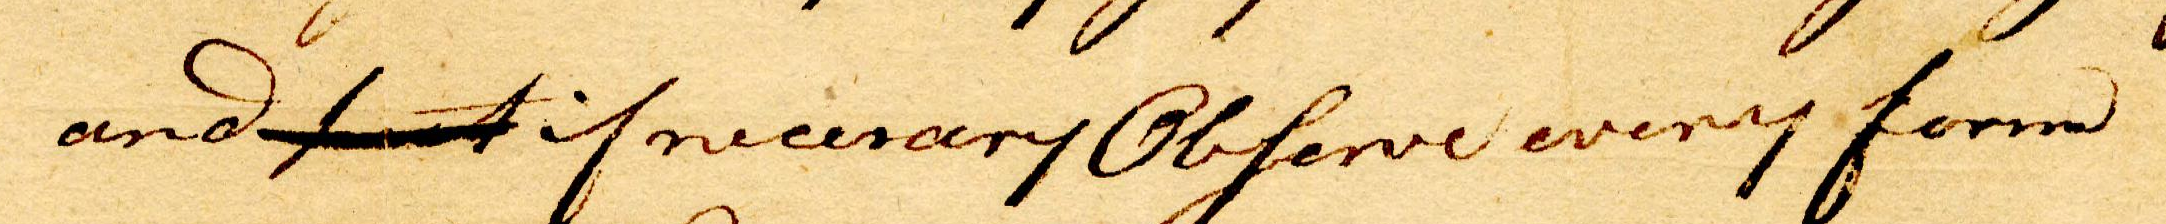and [___] if necesary Observe every form
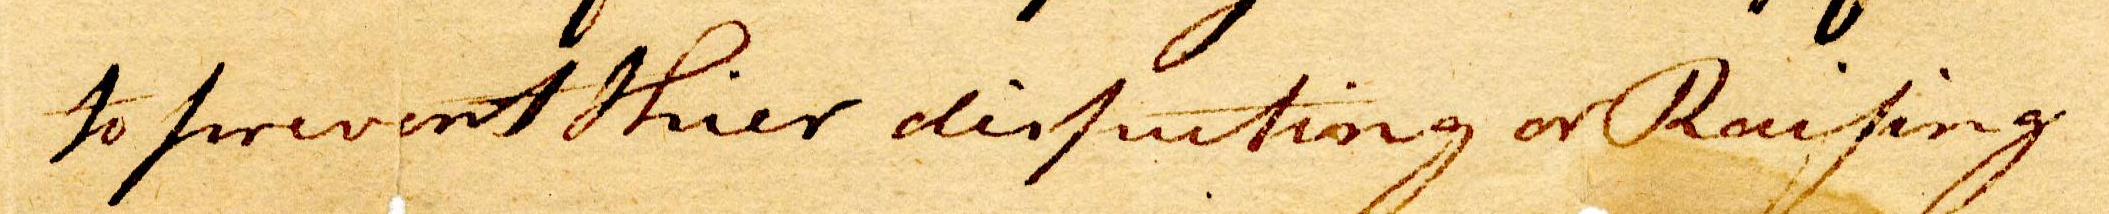to prevent thier distructing or Raising
